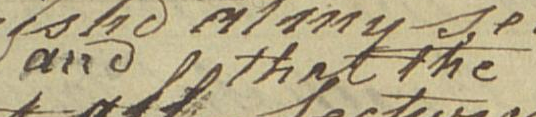and that the
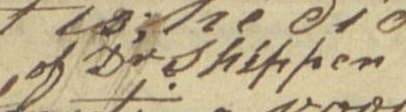of D^r Shippen
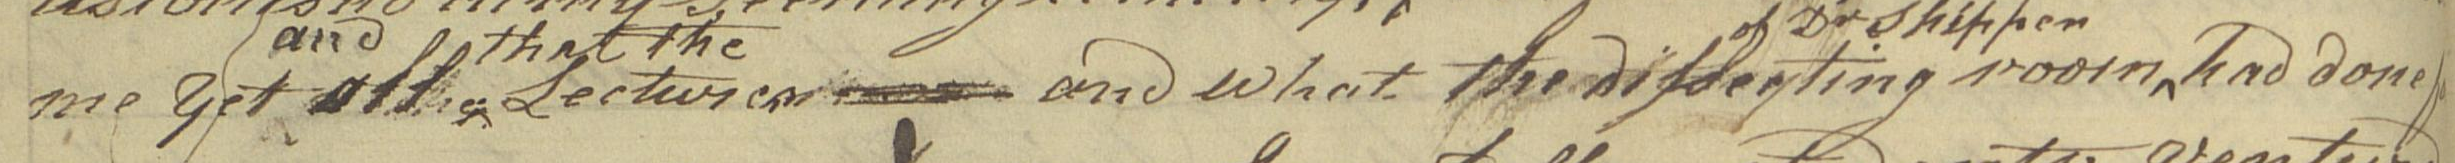me yet all ^ Lectures and what the dissecting room ^ had done
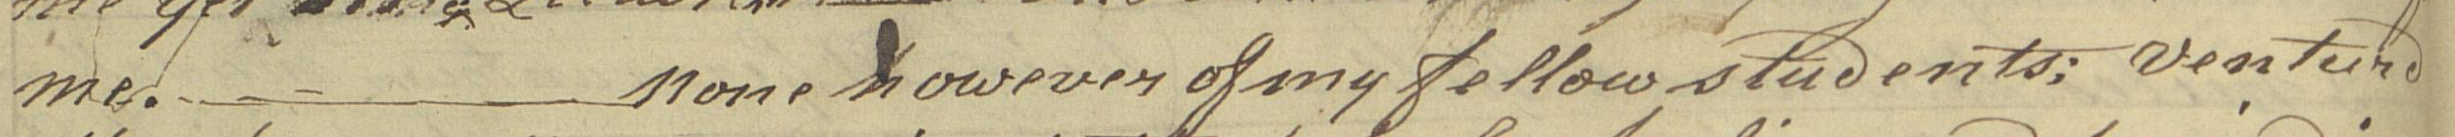me. None however of my fellow students; ventur'd
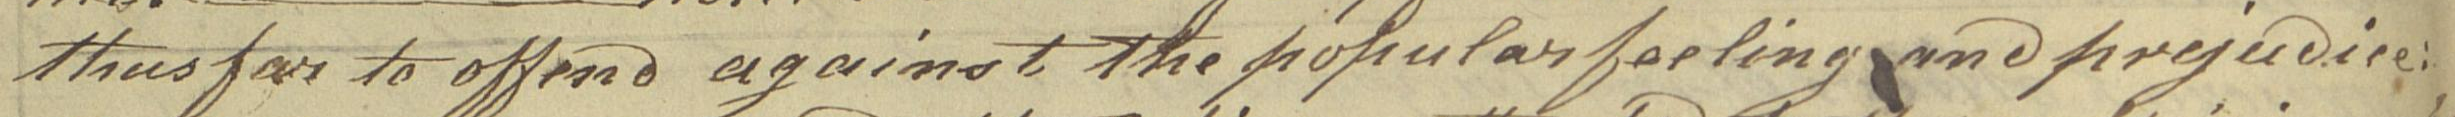thus far to offend against the popular feeling, and prejudice
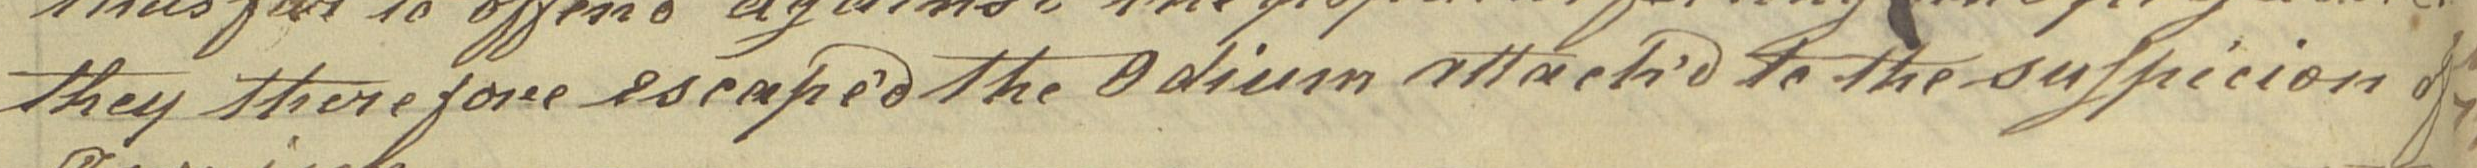they therefore escaped the Odium attach'd to the suspicion of
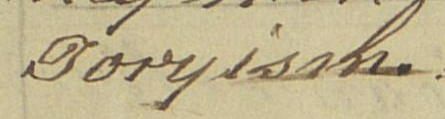Toryism.
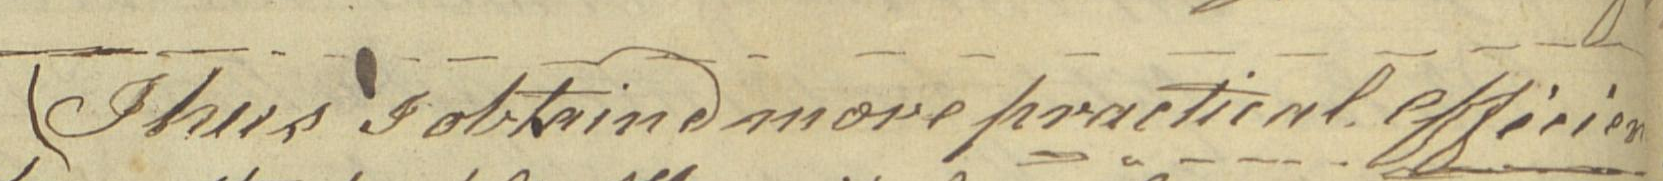Thus I obtaind more practical efficien-
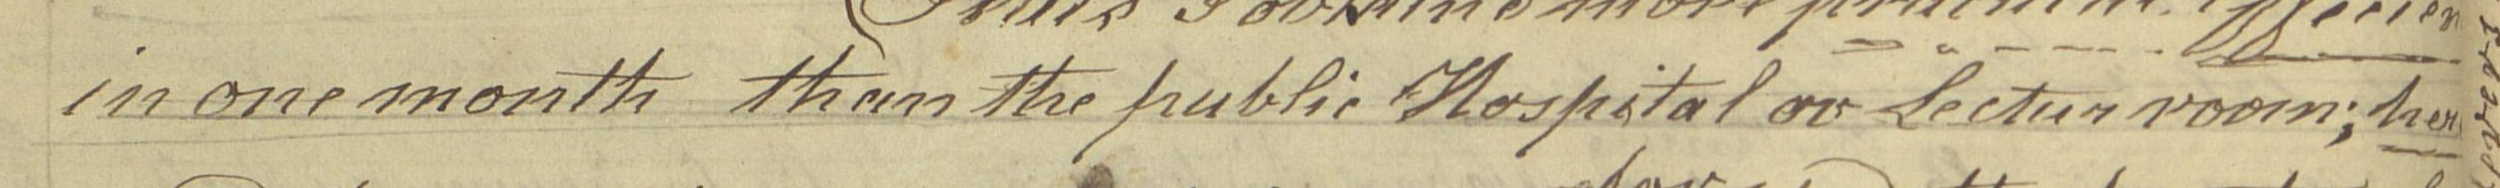in one month than the public Hospital or Lectur room; here
